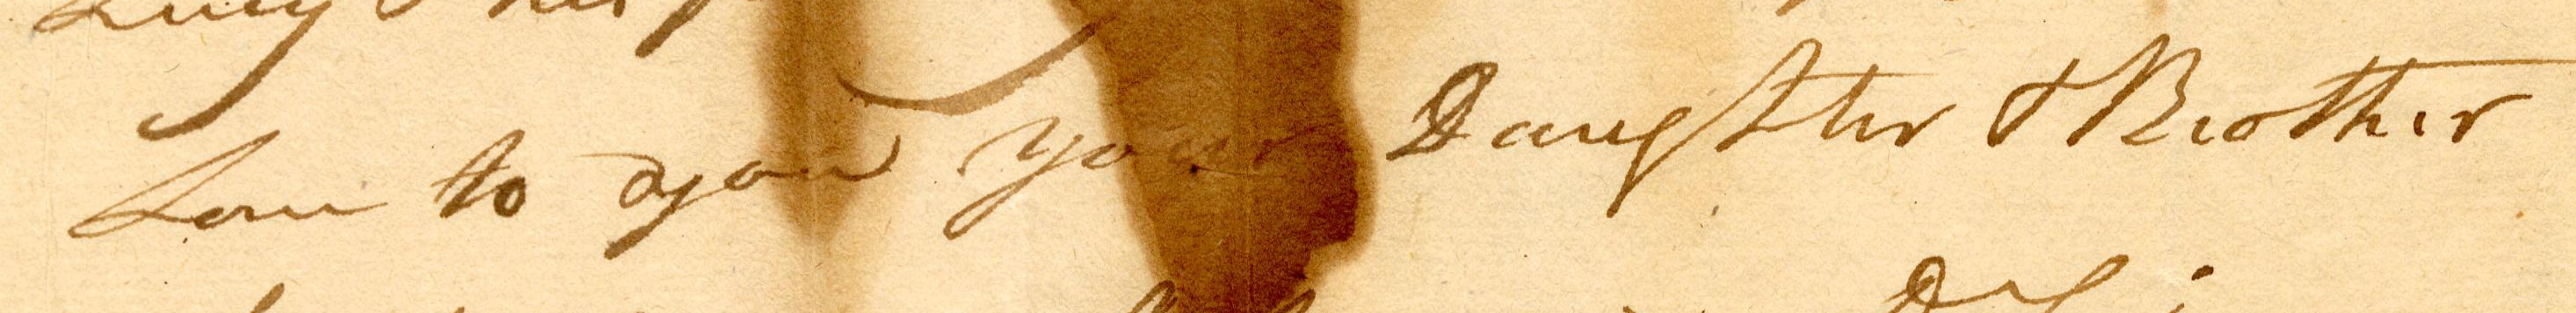love to you your Daughter & Brother
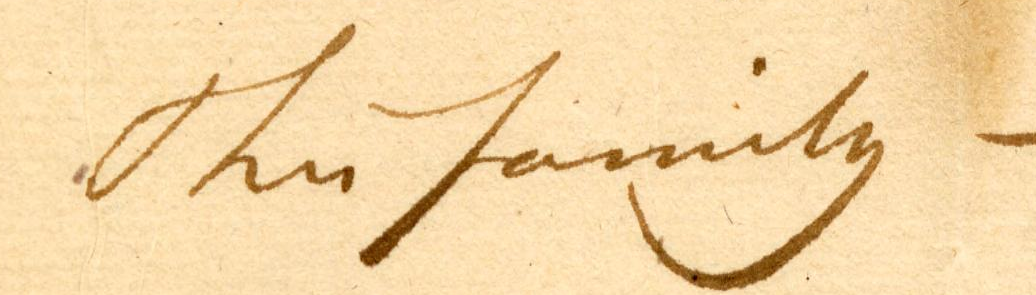& his family-
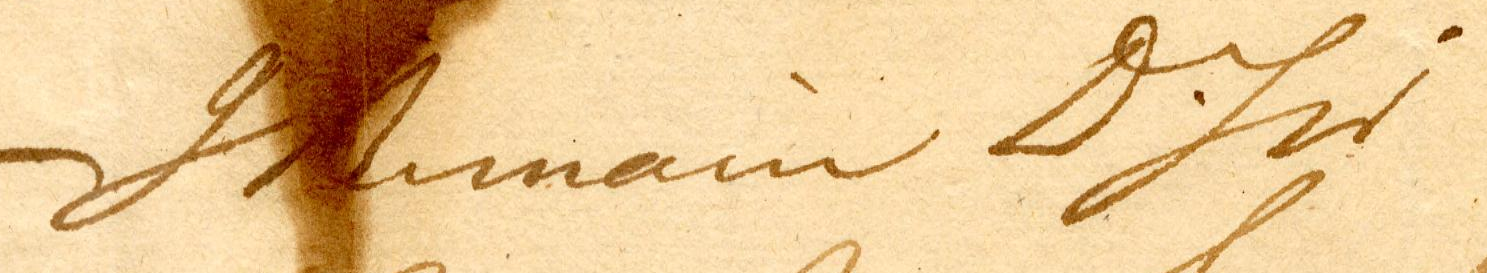I remain D^r Sir
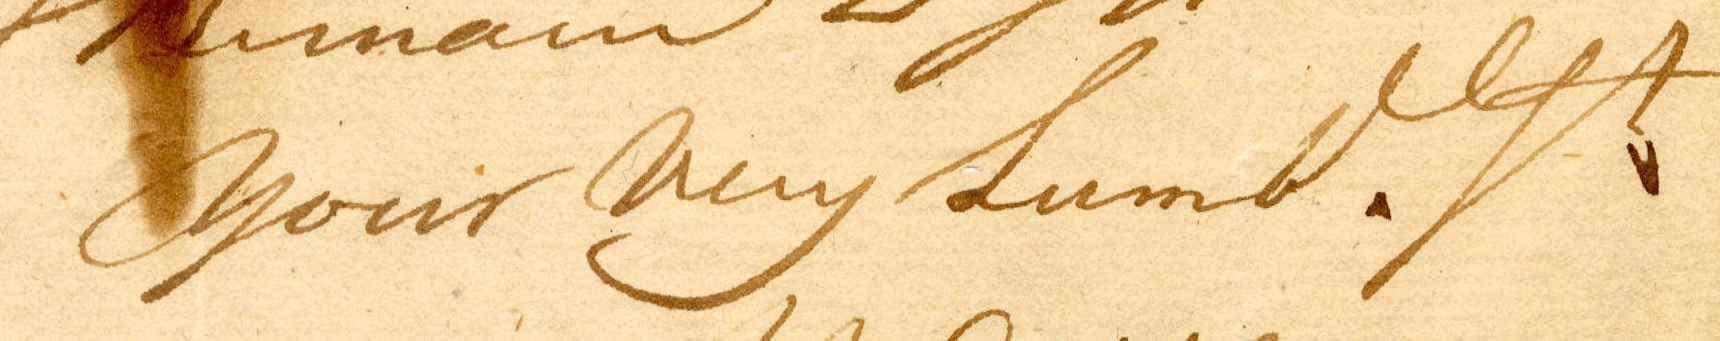Your very humb^e S^t
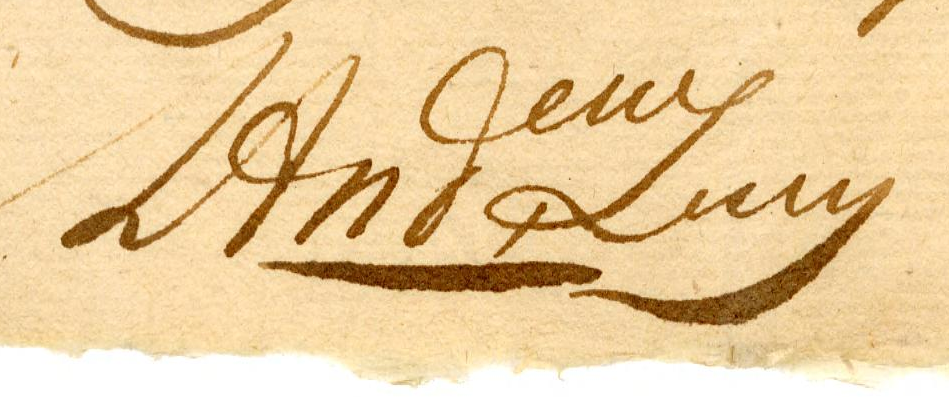Andrew Levy
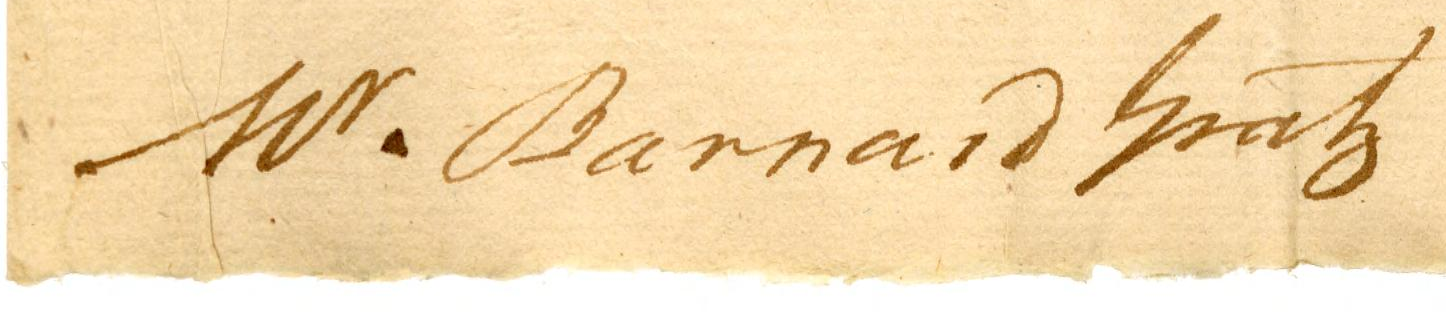M^r. Barnard Gratz
